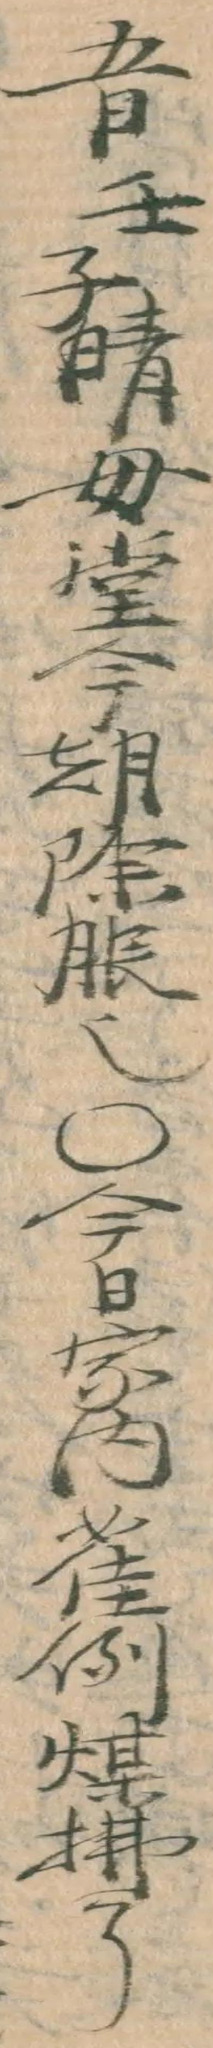五日壬子晴母堂今朝除服也○今日家内如佳例煤払了
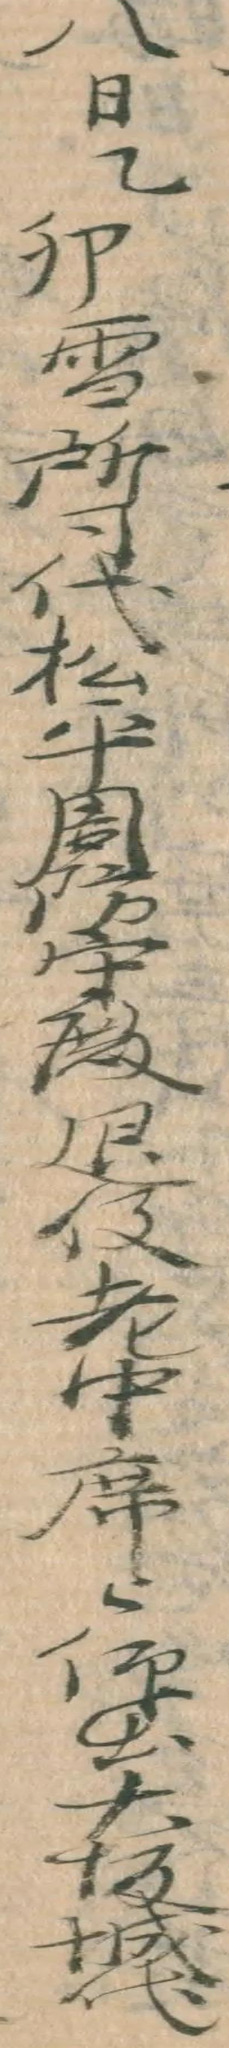八日乙卯雪所司代松平周防守殿退役老中席被仰出大坂城代
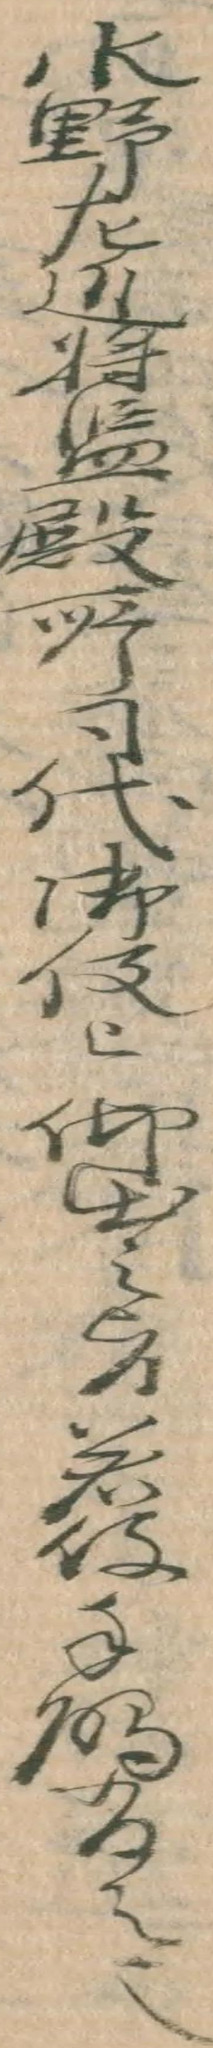水野左近将監殿所司代御役被仰出之旨若役手触有之也
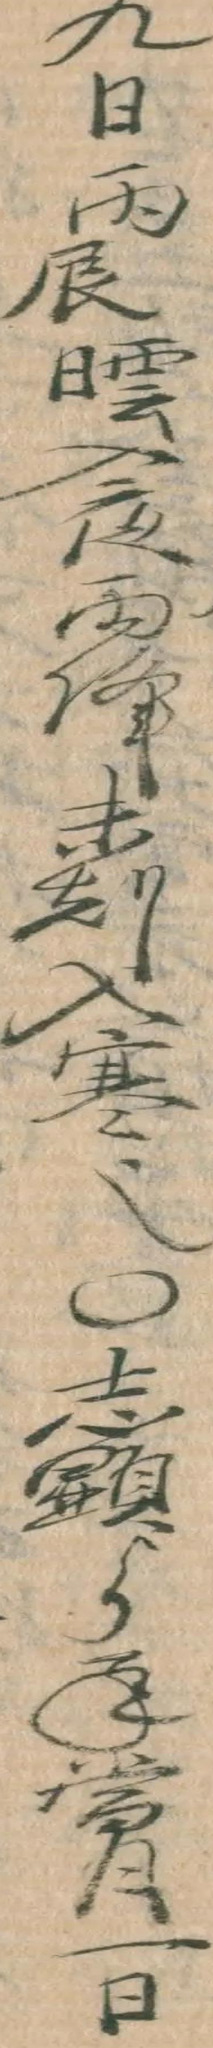九日丙辰曇入夜雨降未刻入寒也〇志顕より年當月一日
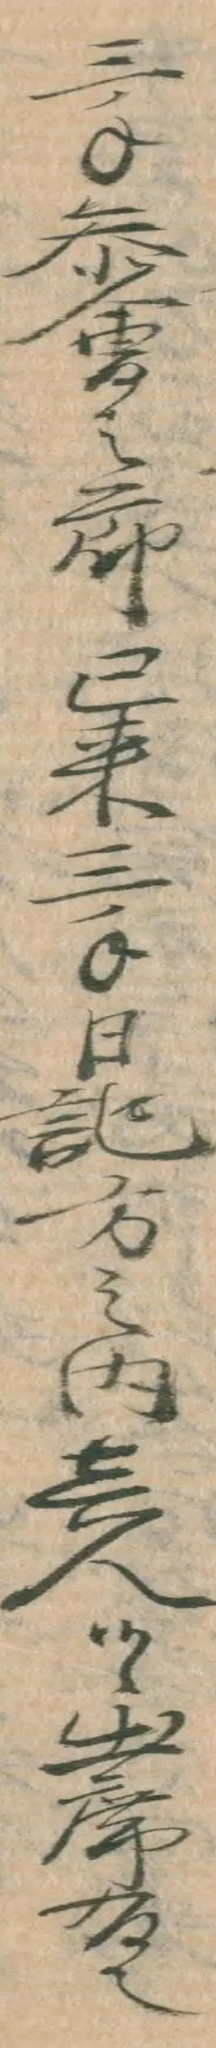三手参會之節已来三手日記方之内壱人ツヽ出席有之
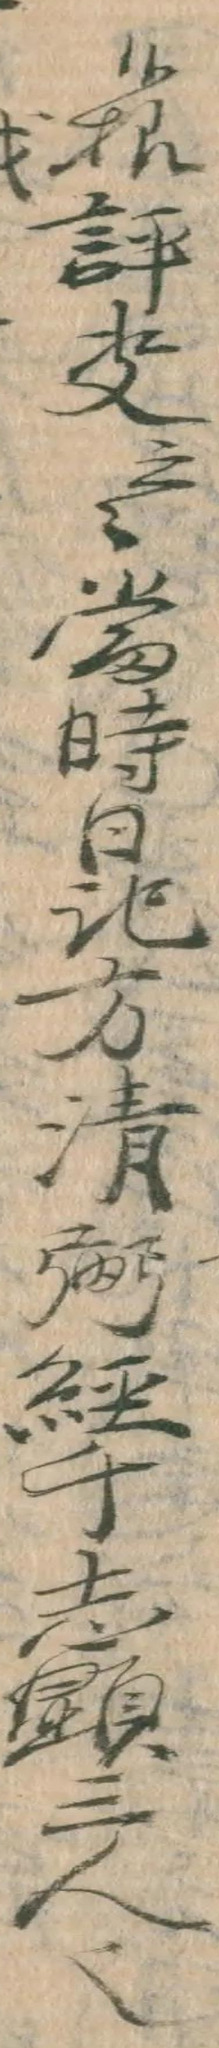候様評決云々當時日記方清弼経千志顕三人也
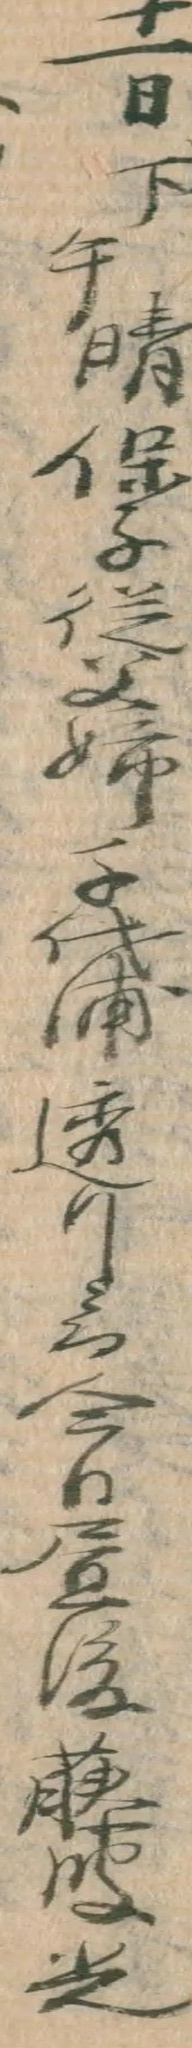十一日戊午晴保子従父姉千代浦透引ニ而今日昼後藤波光
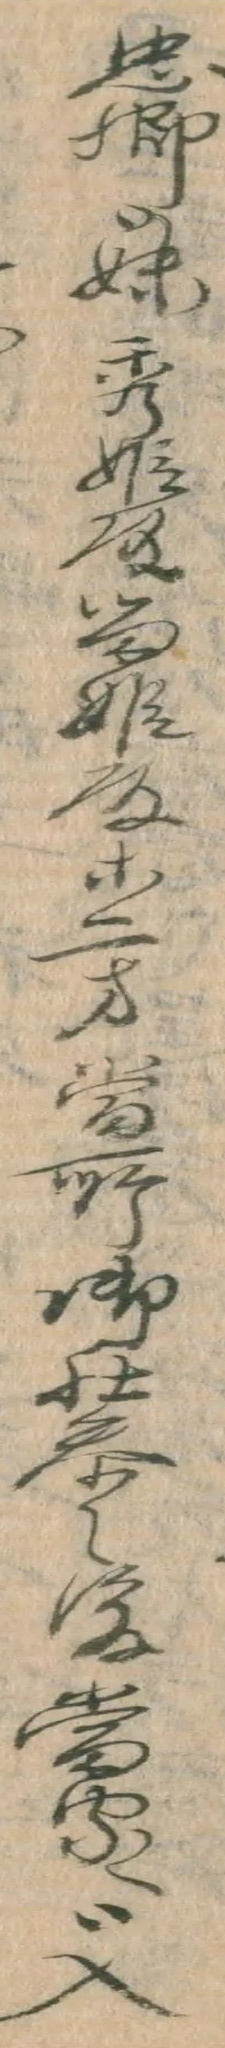忠卿御妹秀姫殿留姫殿等二方當所御社参之後當家へ御入
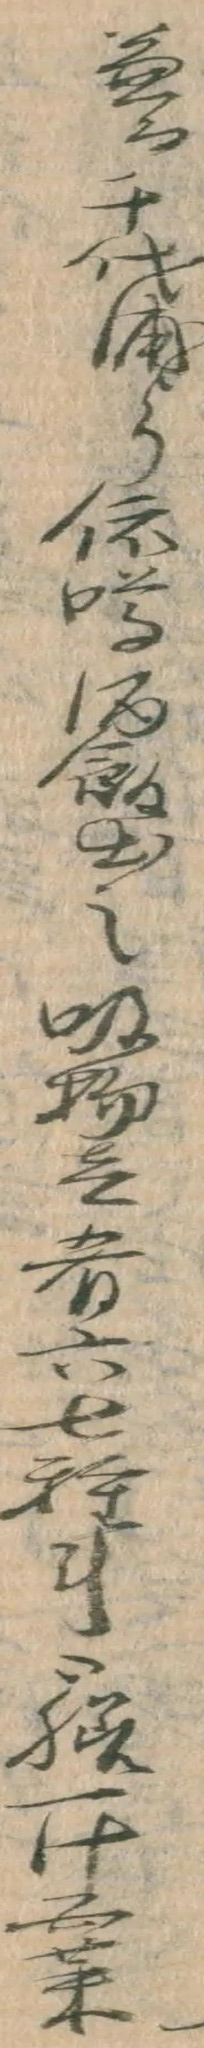兼而千代浦より依噂酒飯出之吸物壱肴六七種斗御膳一汁五菜
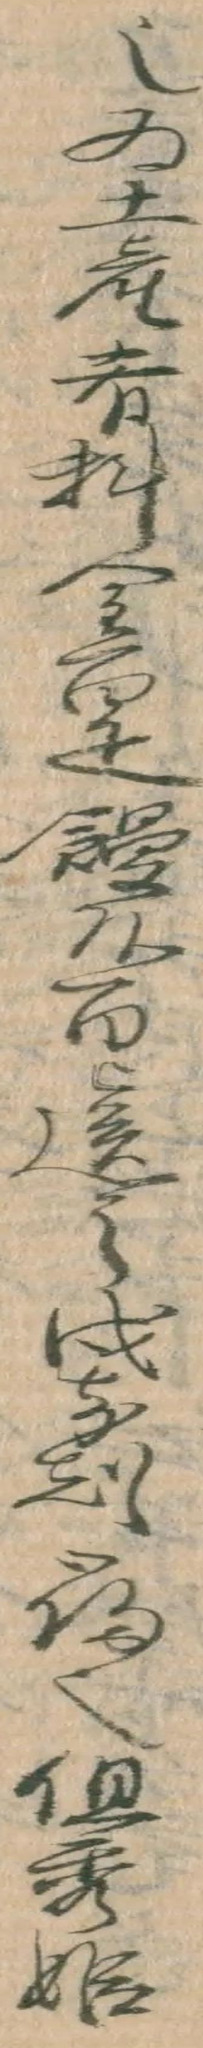之為土産肴料金百疋饅頭百被送之戌前刻御帰也但秀姫
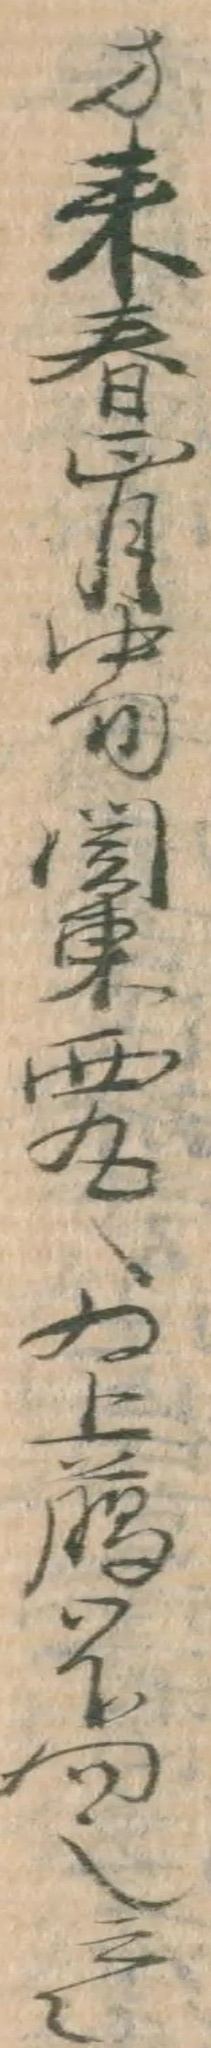方来春正月中旬関東西丸へ為上臈御下向也云々
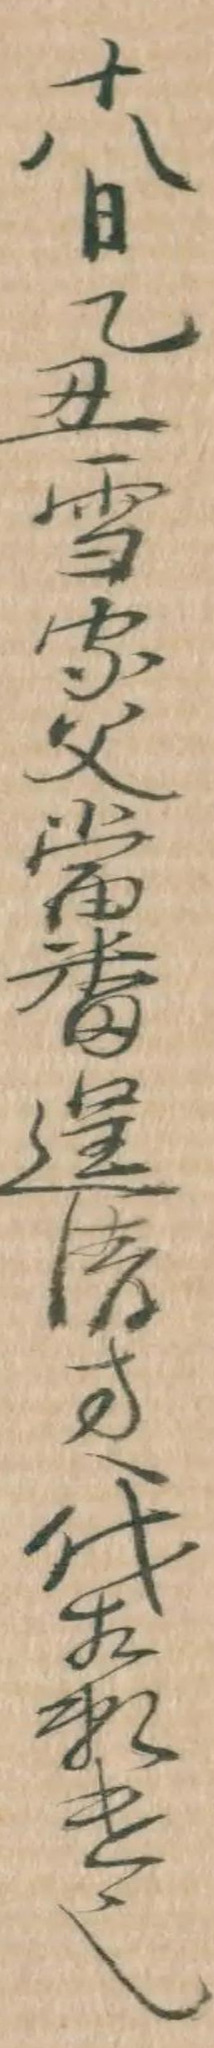十八日乙丑雪家父當番逞清方へ代相頼遣也
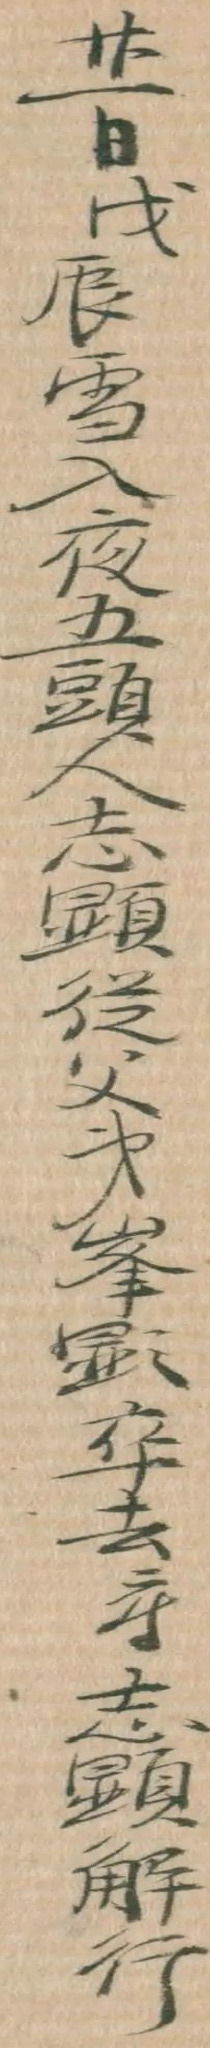廿一日戊辰雪入夜五頭人志顕従父弟峯顕卒去ニ付志顕解行
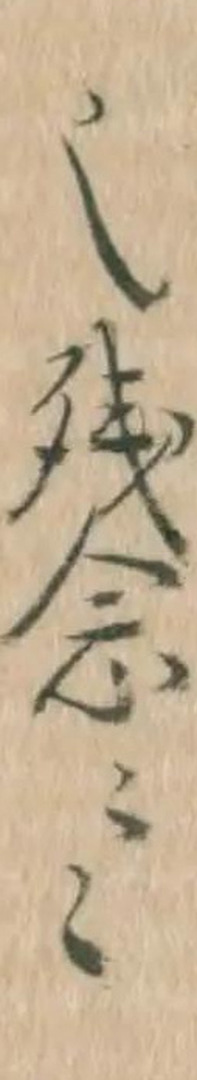也残念々々
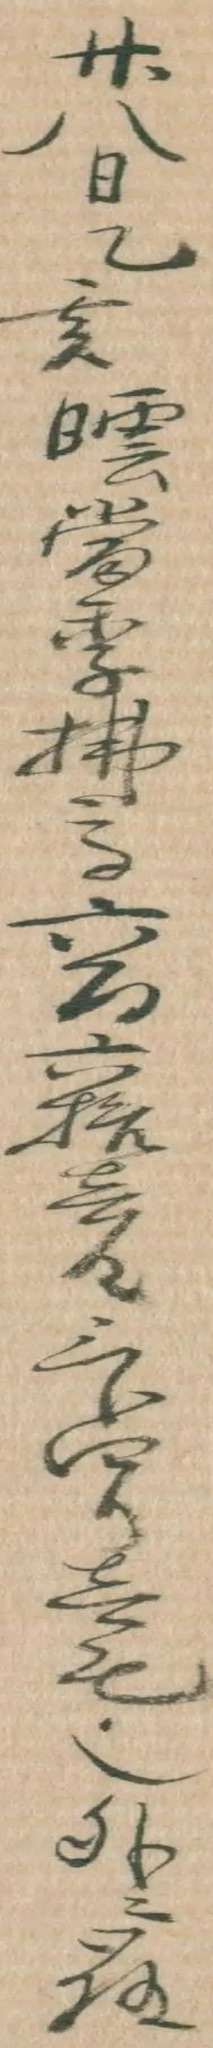廿八日乙亥曇當季払高六百六拾壱匁三分四り壱毛也外に御座
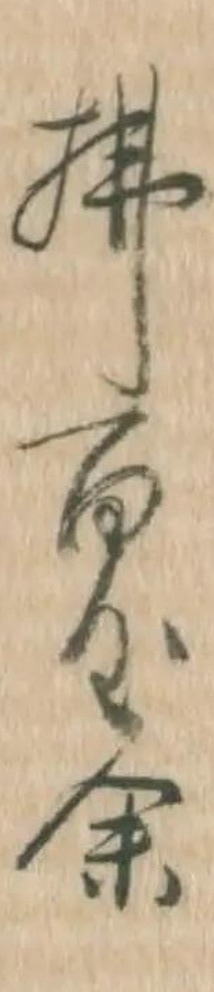払百匁余
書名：賀茂社記録. 第65冊
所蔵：国立国会図書館 National Diet Library, JAPAN
